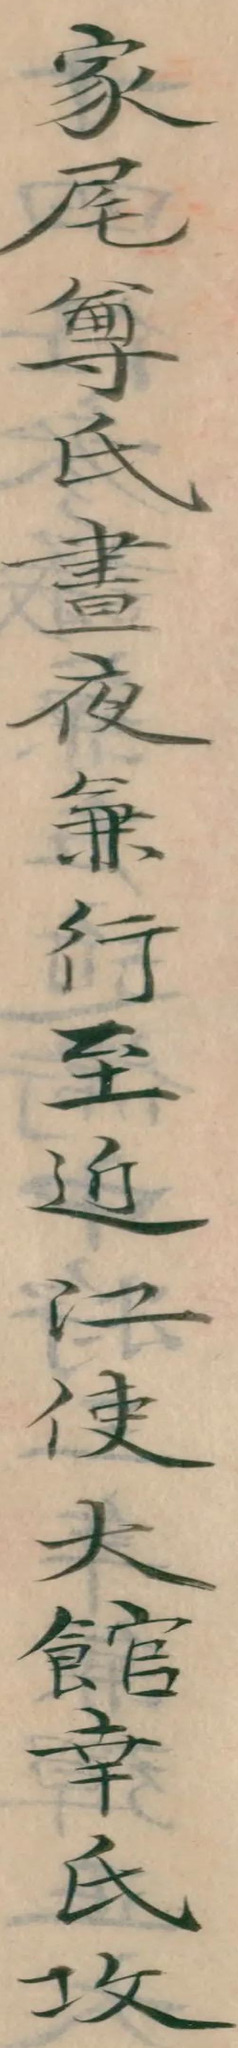家尾尊氏昼夜兼行至近江使大館幸氏攻
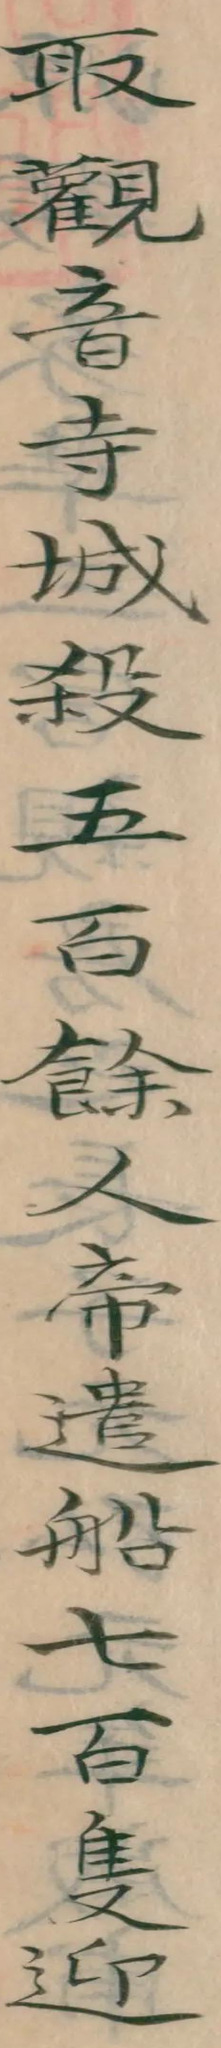取観音寺城殺五延暦百余人帝遣船七百隻迎
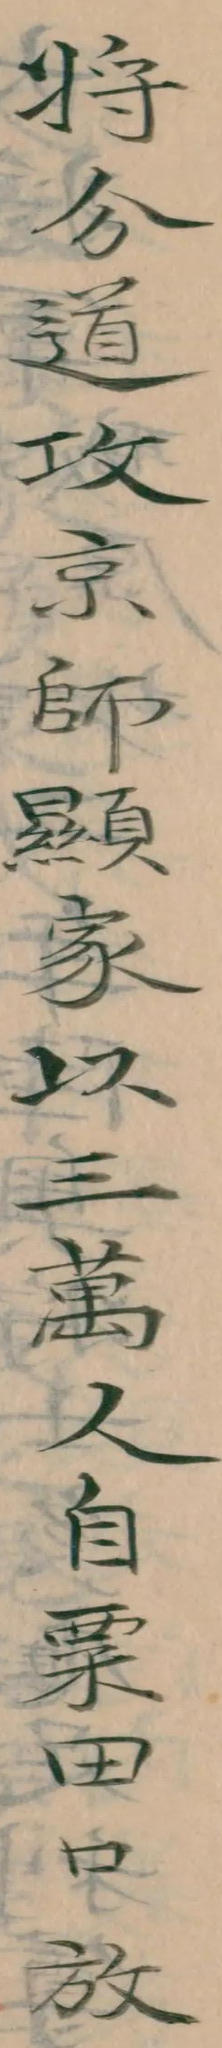将分道攻京師顕家以三万人自粟田口放
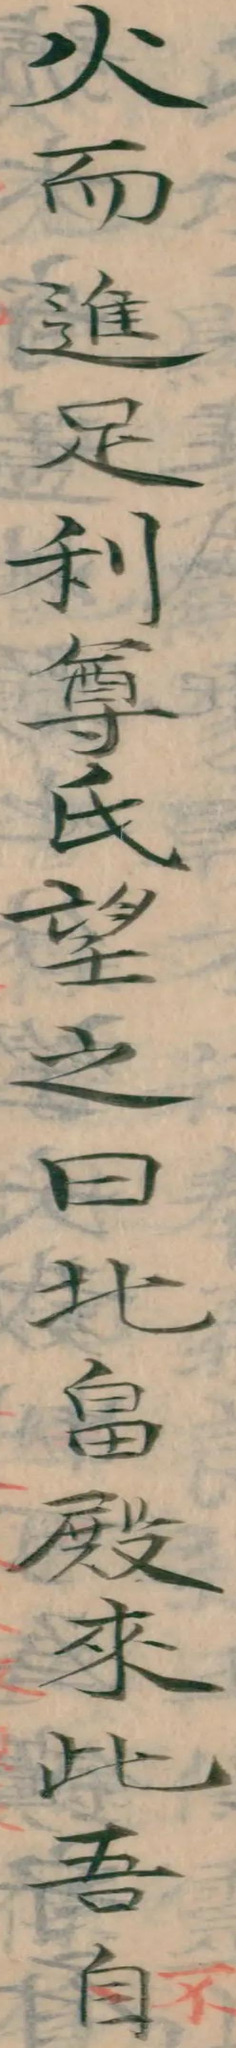火而進足利尊氏望之日北畠殿来此吾自不
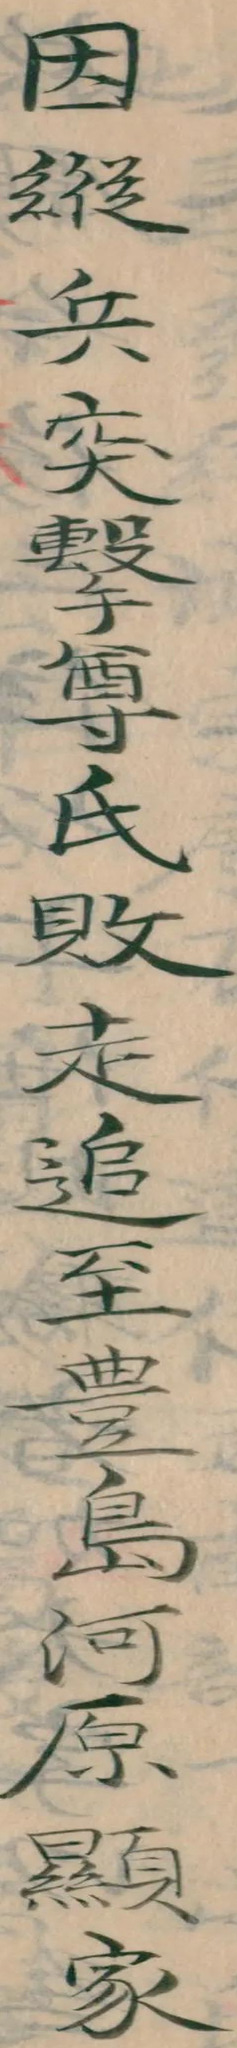因縦兵突撃尊氏敗走追至豊島河原顕家
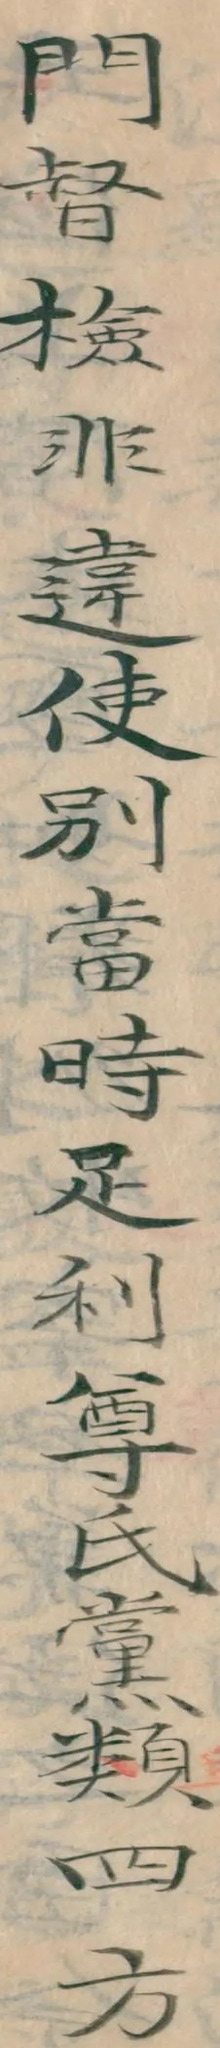門督検非違使別当時足利尊氏党類与四方
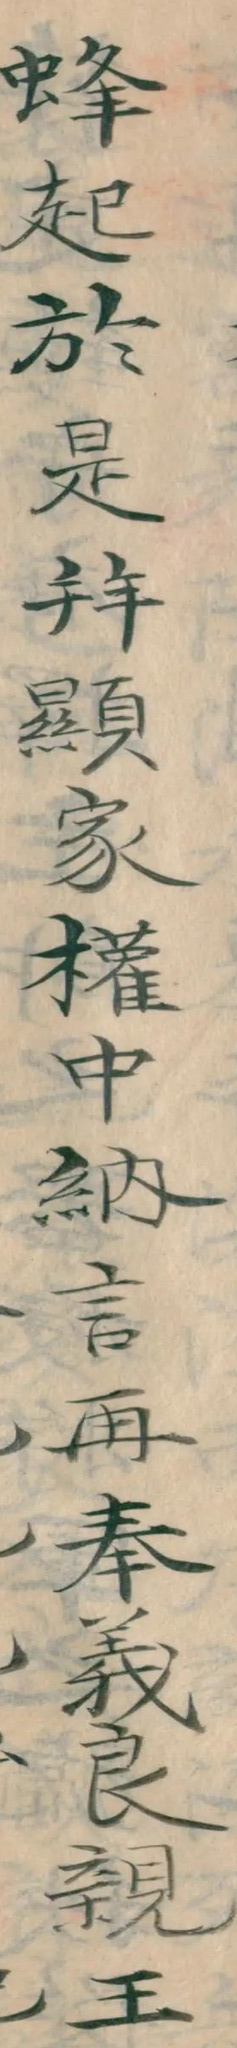蜂起於是拝顕家権中納言再奉義良親王

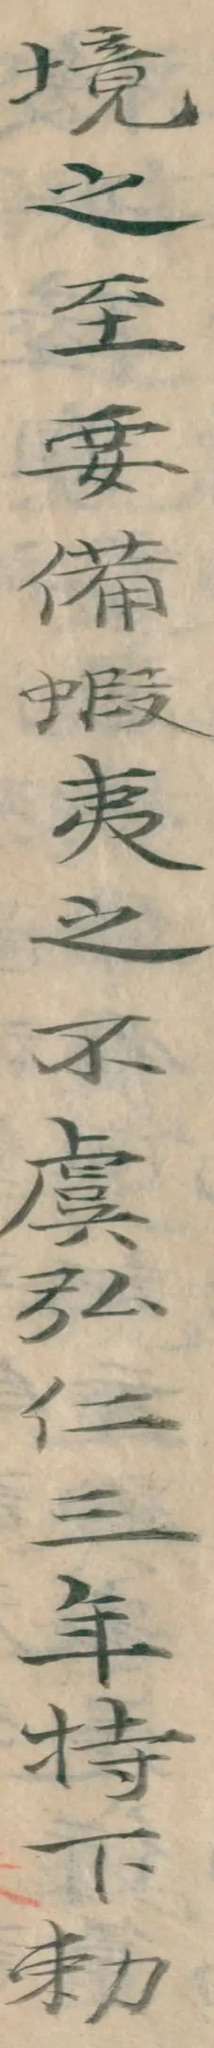境之至要備蝦夷之不虞弘仁三年持下勅
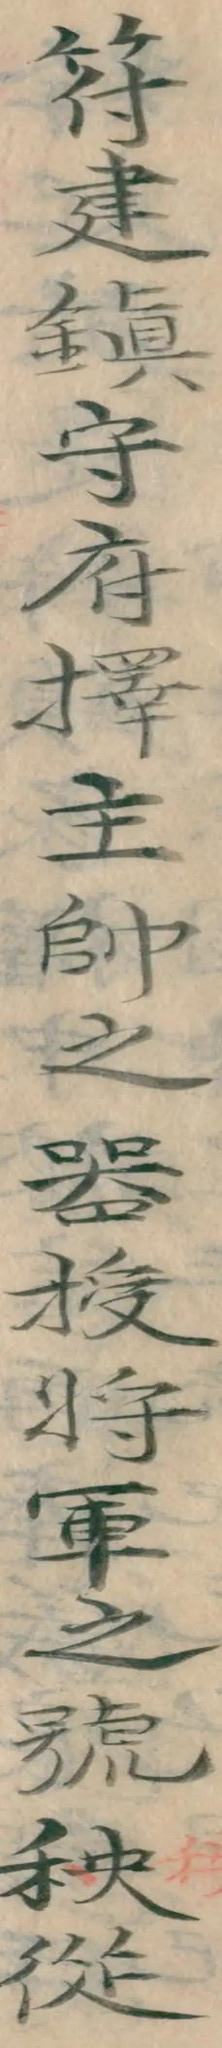符建鎮守府択主帥之器授将軍之号秧秩従
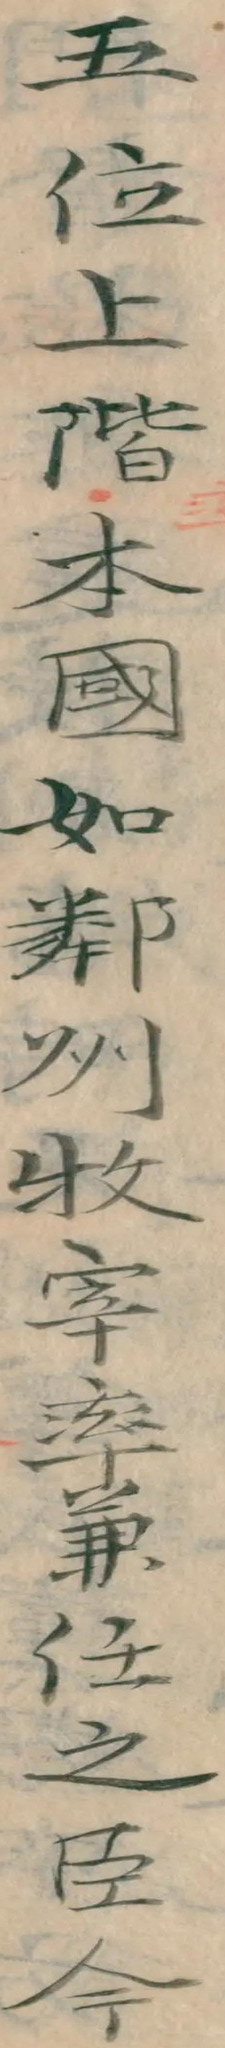五位上階率本国如鄰州牧宰率兼任之臣今
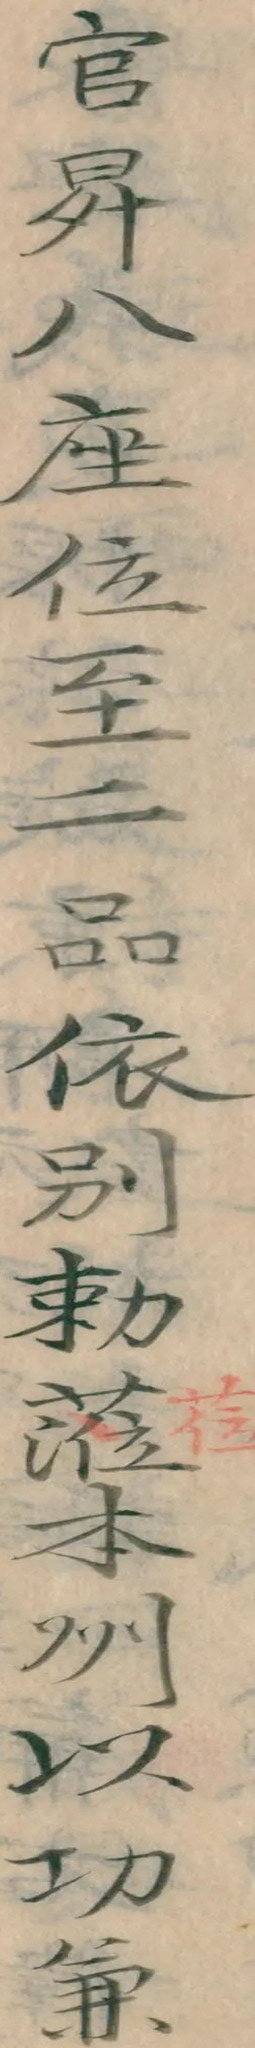官昇八座位至二品依別勅蒞莅本州以功兼
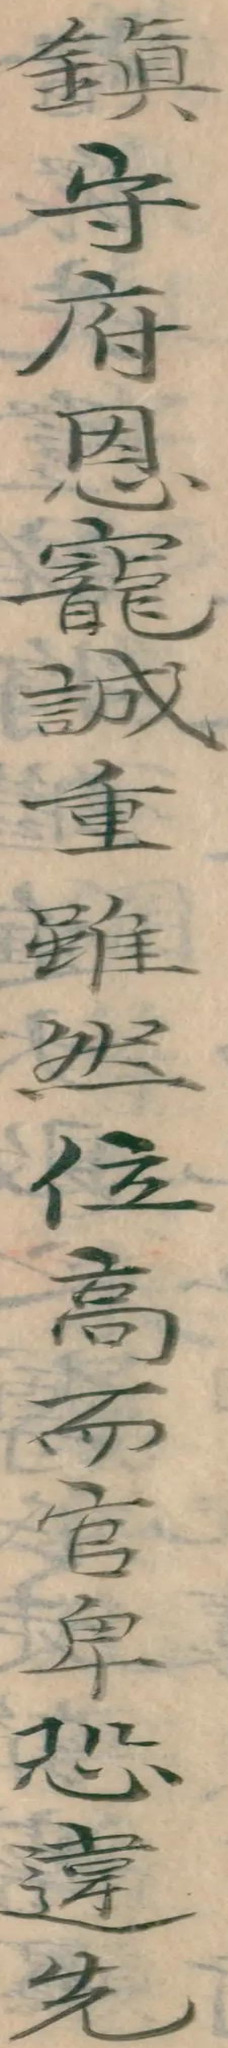鎮守府恩寵誠重雖然位高而官卑恐違先
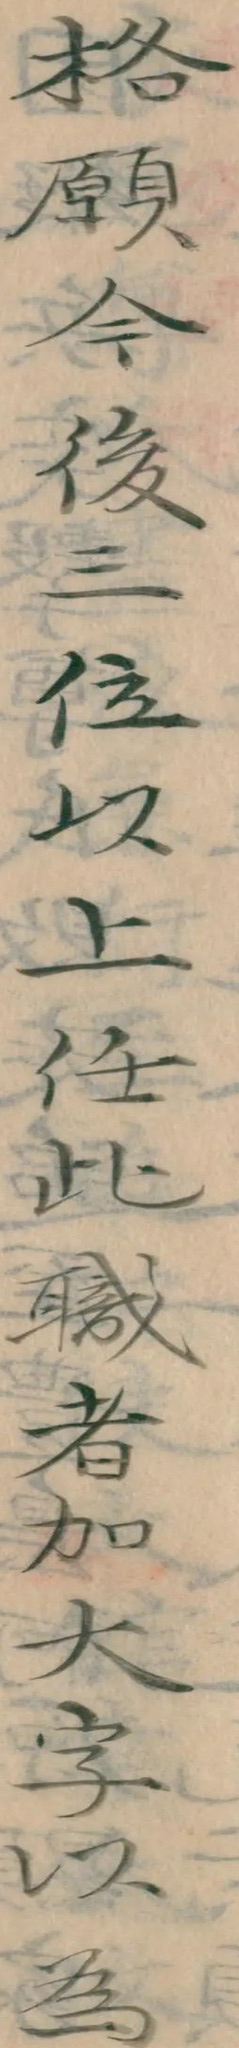格願今後三位以上任此職者加大字以為
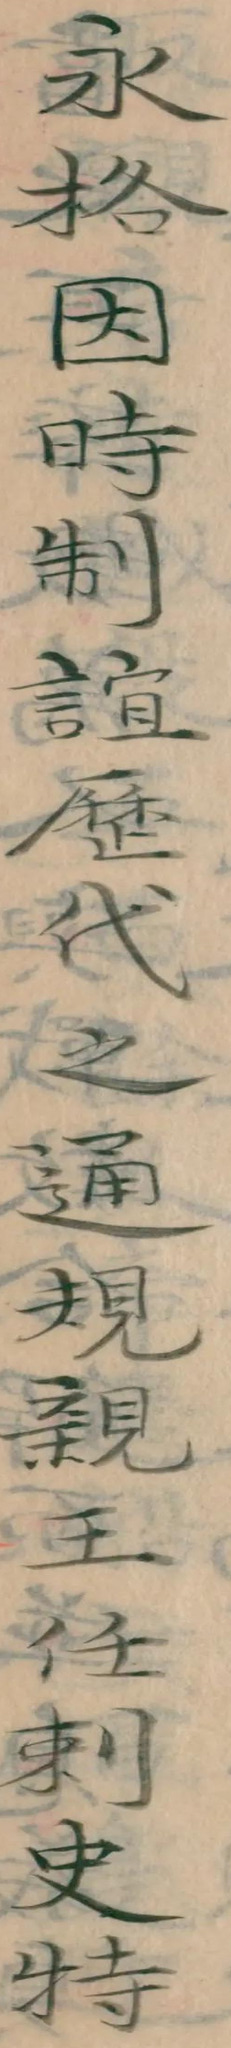永格因時制誼歴代之通規親王任刺史特
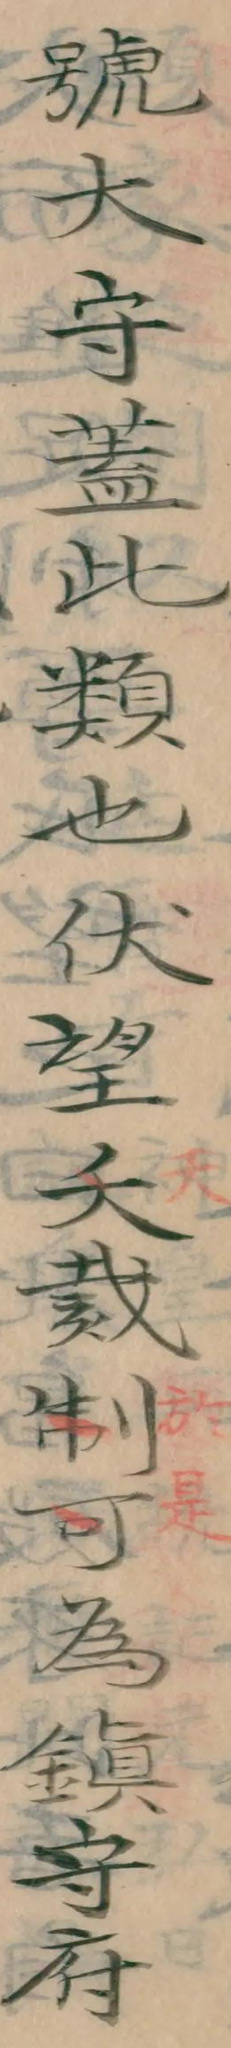号大守蓋此類也伏望夭天裁制可於是為鎮守府
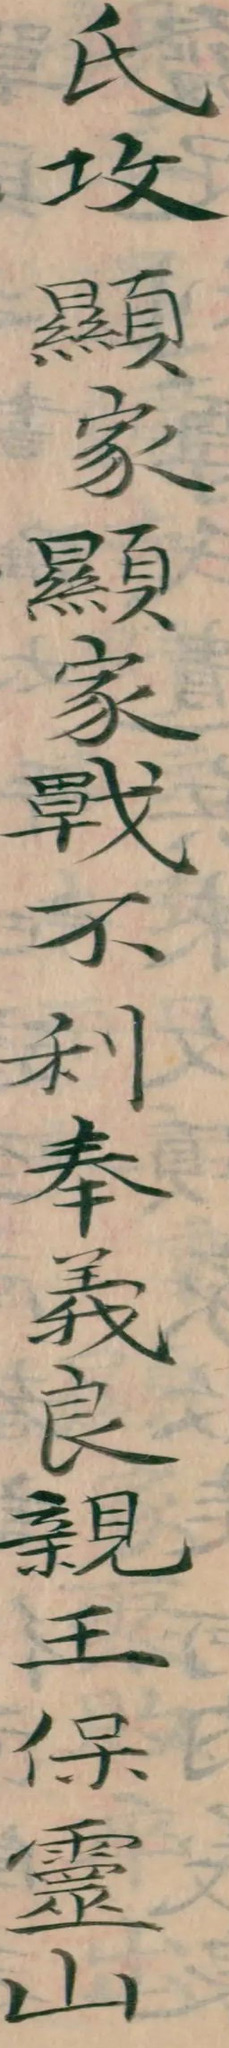氏攻顕家顕家戦不利奉義良親王保霊山
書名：輪池叢書. 12
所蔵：国立国会図書館 National Diet Library, JAPAN
